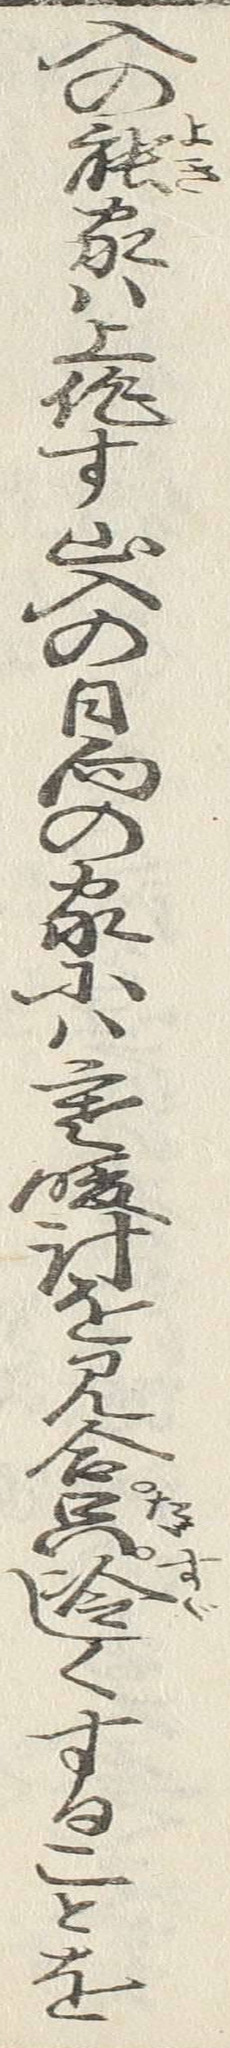入の能家は上作す山入の日向の家には寒暖計を見合。只。冷しくすることを
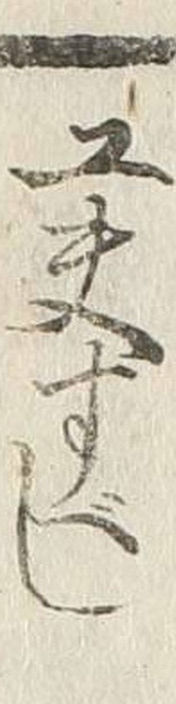工夫すべし
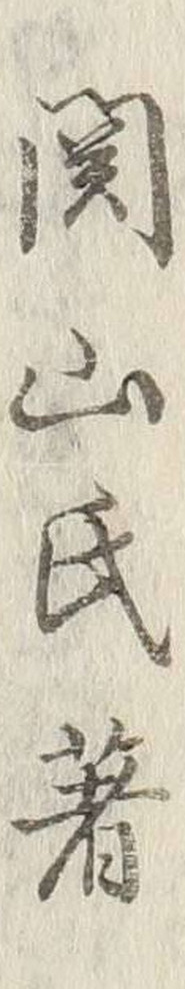関山氏著
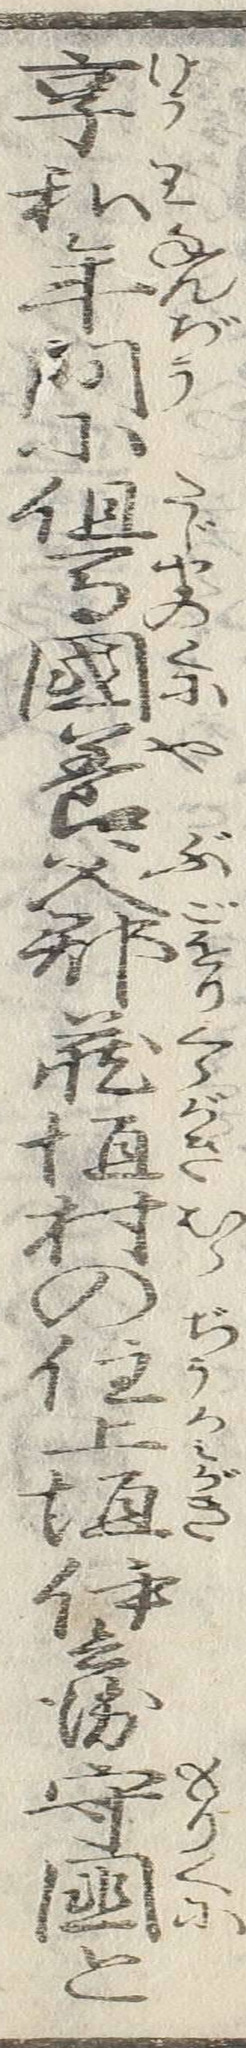享和年間に但馬國養父郡蔵垣村の住上垣伊兵衛守国と
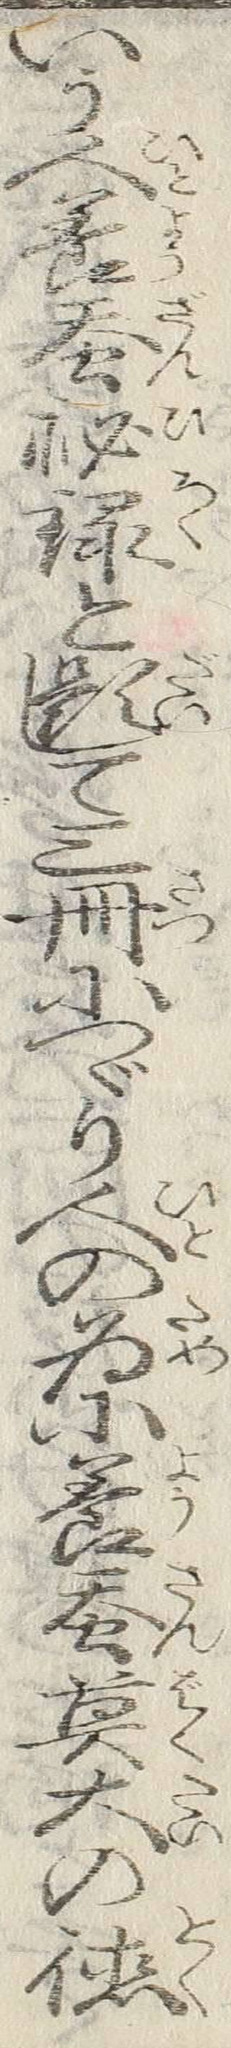いう人養蚕秘録と題して三冊につゞり人の為に養蚕莫大の徳
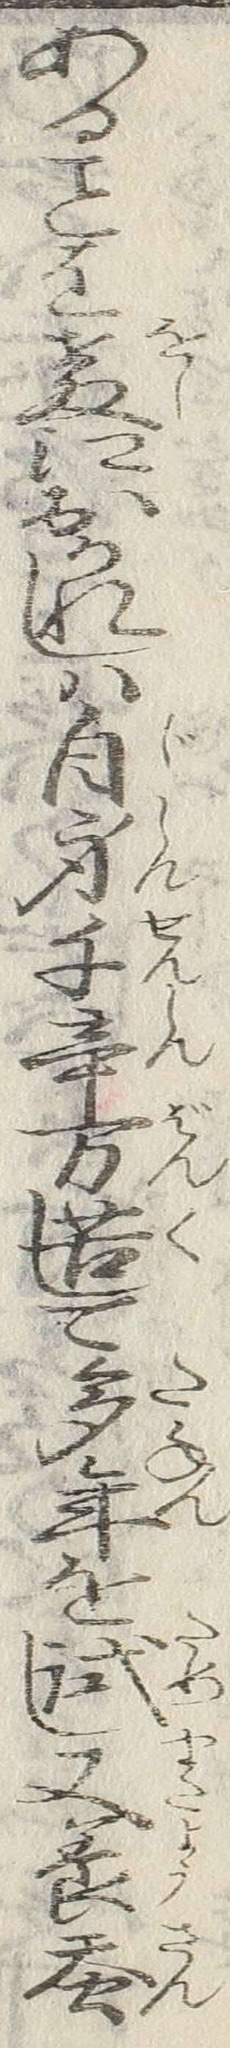あることを教えおかれしは自身千辛万苦して多年を試し又養蚕
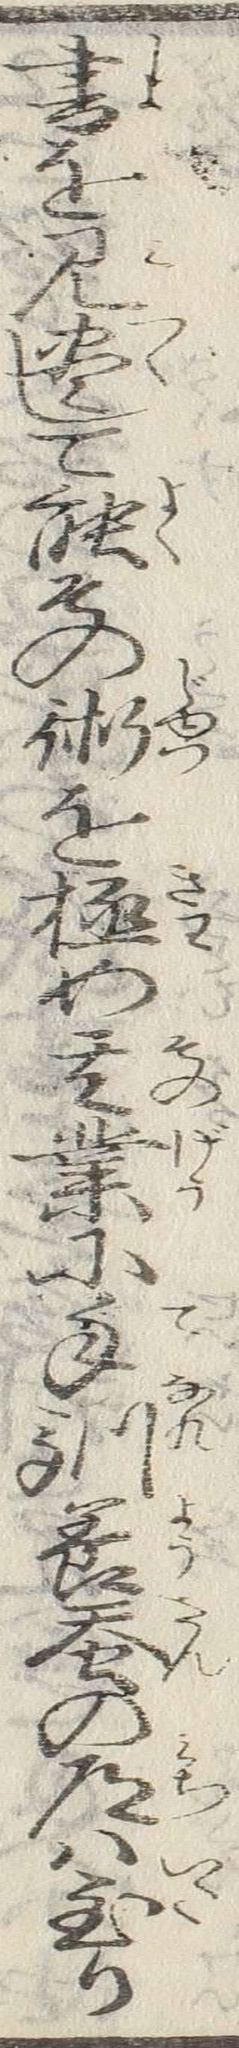書を見尽して能その術を極め其業に手馴養蚕の道は至り
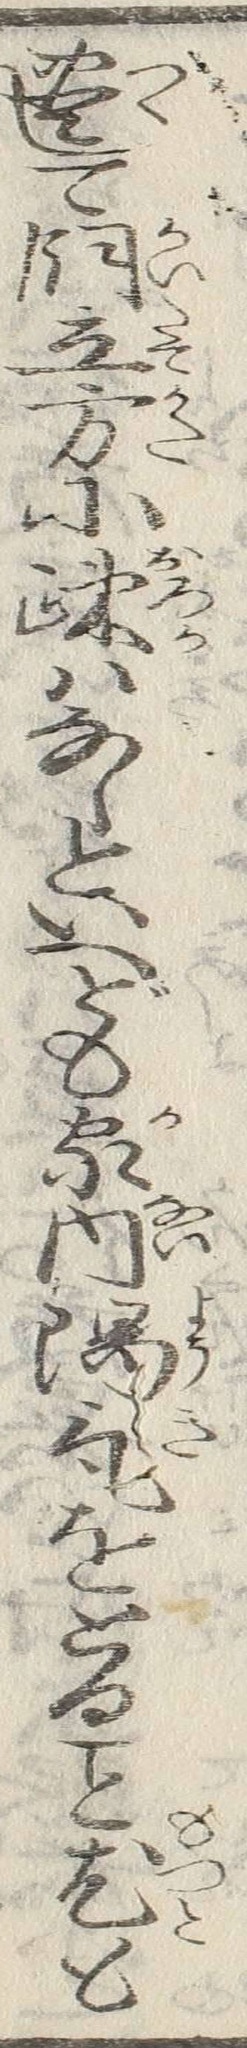尽して飼立方に疎はなしいへども家内陽気をとること尤も
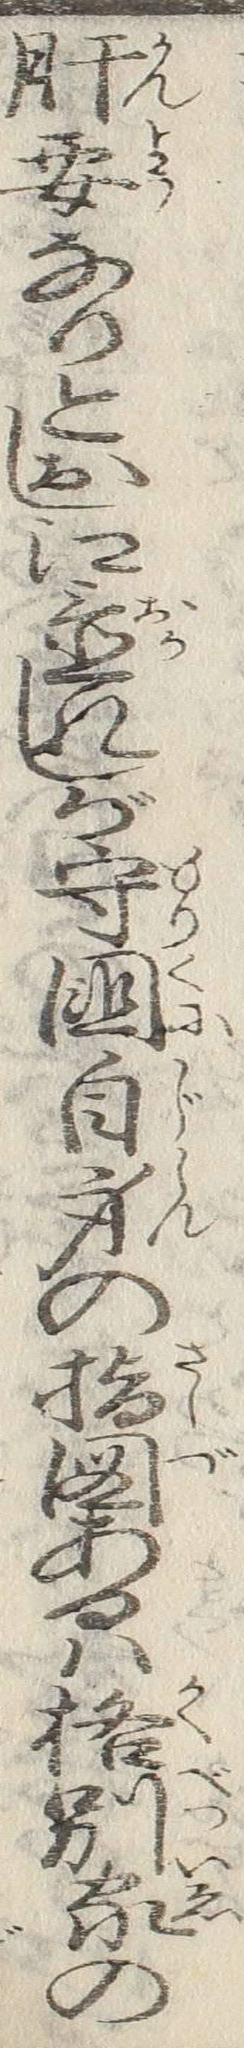肝要なりとおしえ置れしが守國自身の指図あるは格別家の

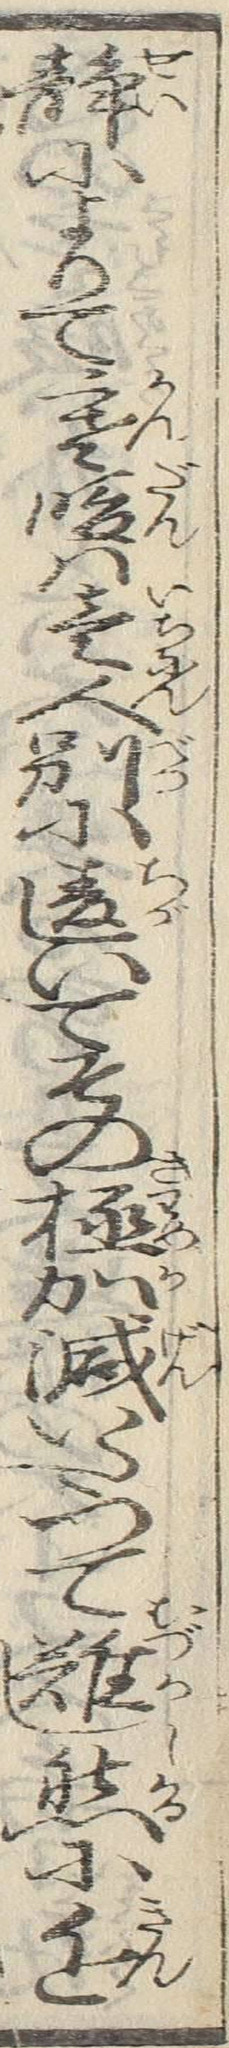静によりて寒暖は壱人別に違いてその極加減いたつて難し然に近
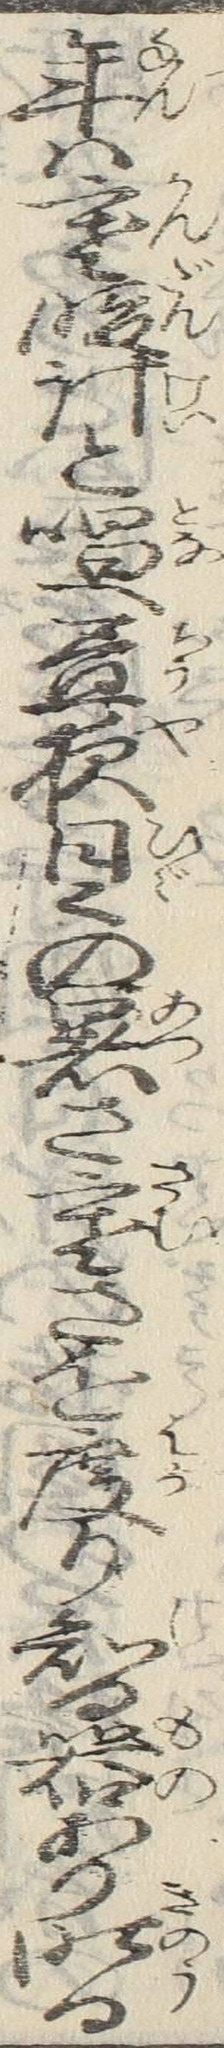年は寒暖計と唱へ昼夜日々の暑さ寒さを度り知る器あり昨日
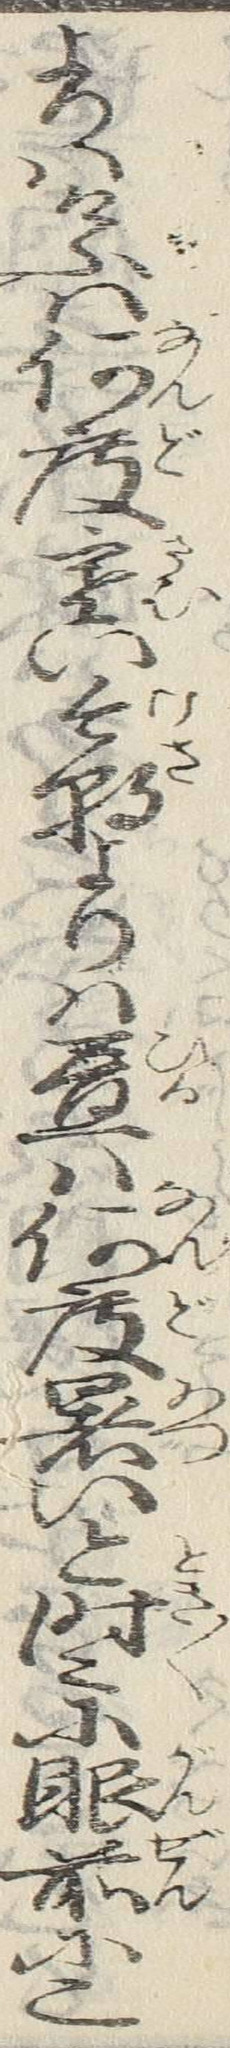よりはけふは何度寒い今朝よりは昼は何度暑いと時々に眼前にこ
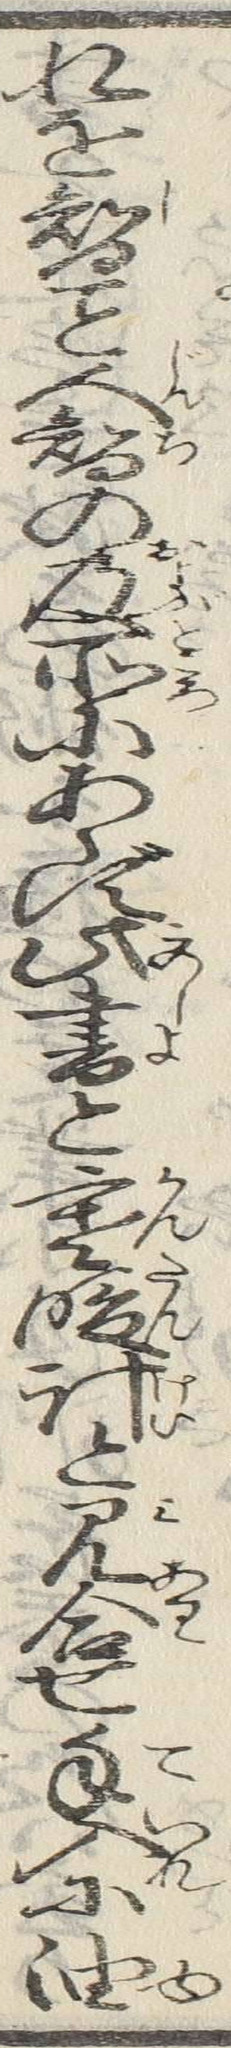れを知ること人智の及所にあらず此書と寒暖計と見合せ手入に油
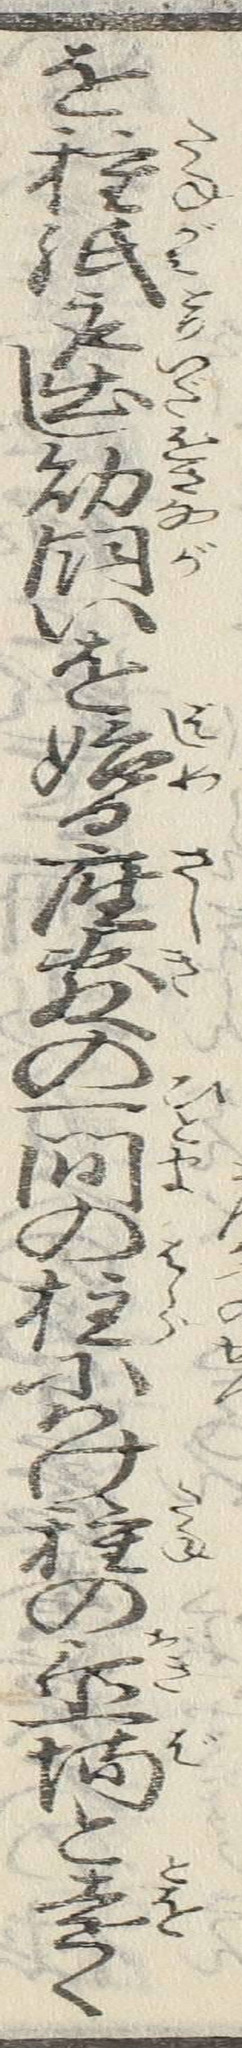を種紙取出し幼飼いを始る座敷の一間の柱にかけ種の置場と遠く
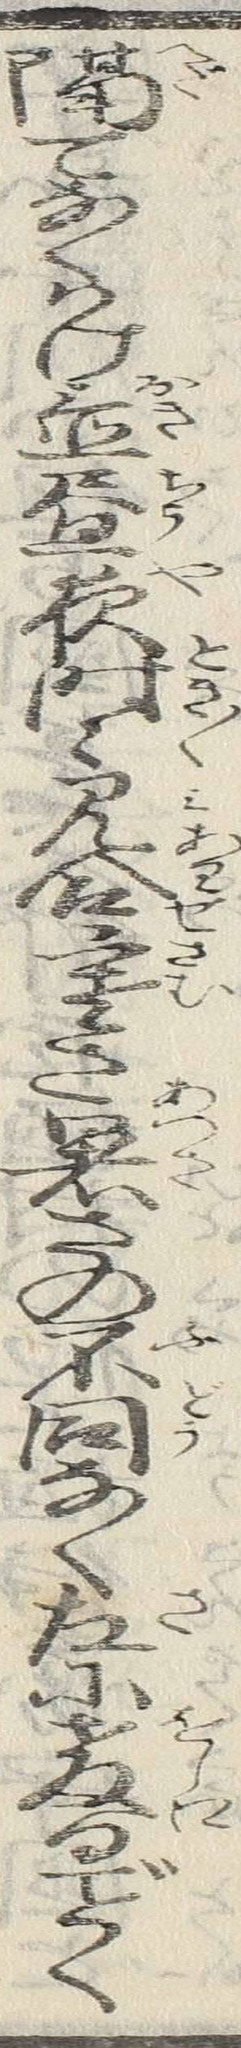隔てなくかけ置昼夜時々見合寒さ暑さの不同なく左に教るごとく
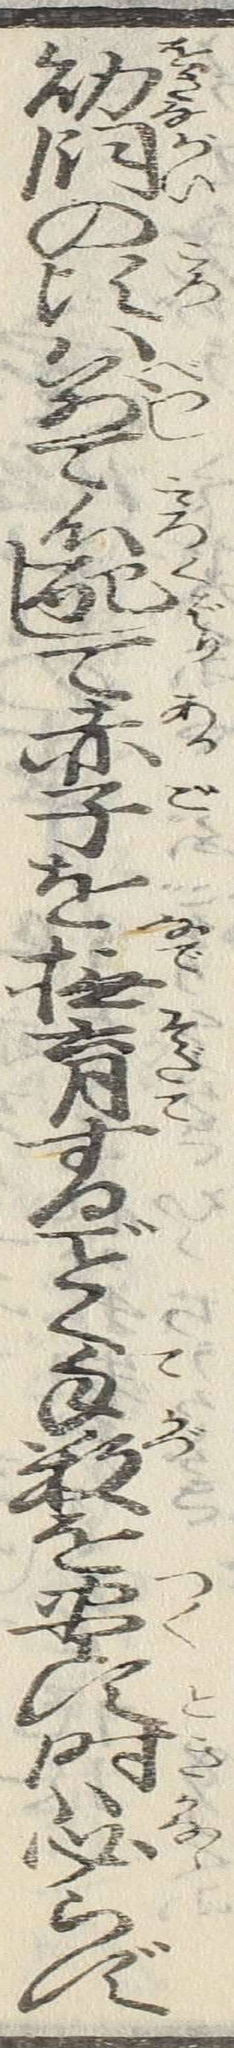幼飼の頃は別て心配して赤子を撫育するごとく手数を尽す時は必らず
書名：養蠶實驗録
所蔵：東京大学農学生命科学図書館 国文学研究資料館
